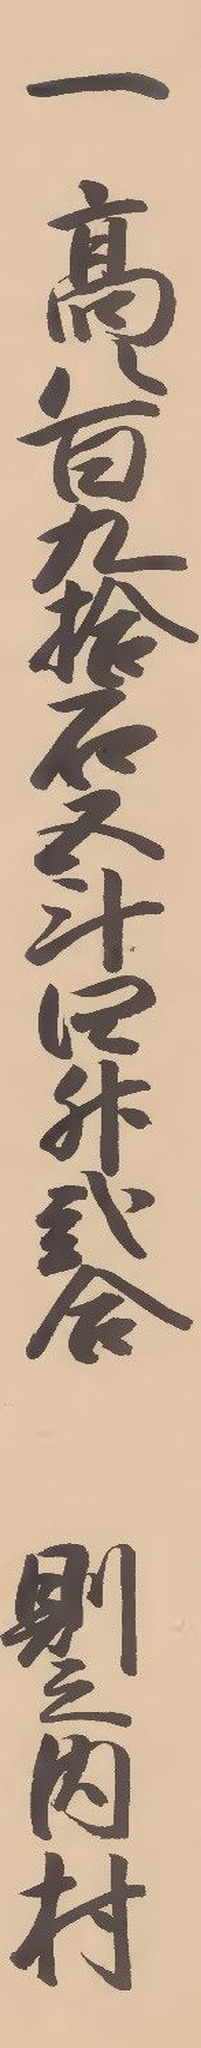一高八百九拾石五斗四升弐合則之内村
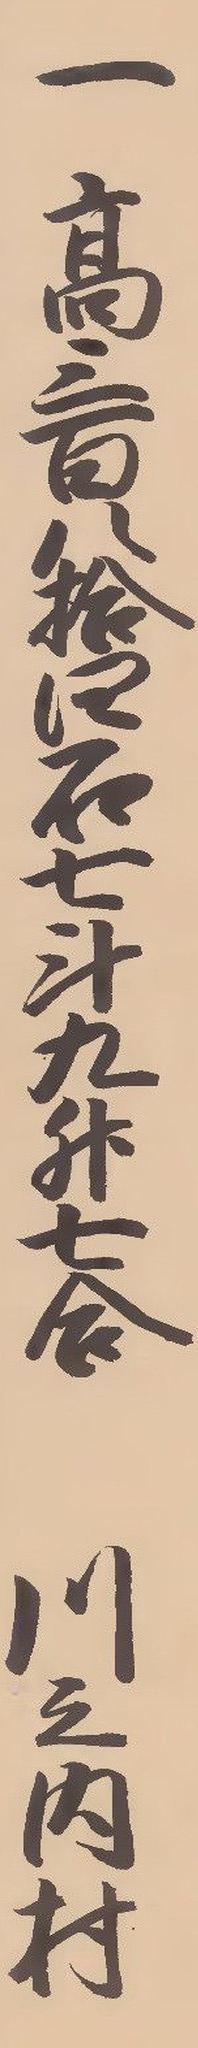一高三百八拾四石七斗九升七合川之内村
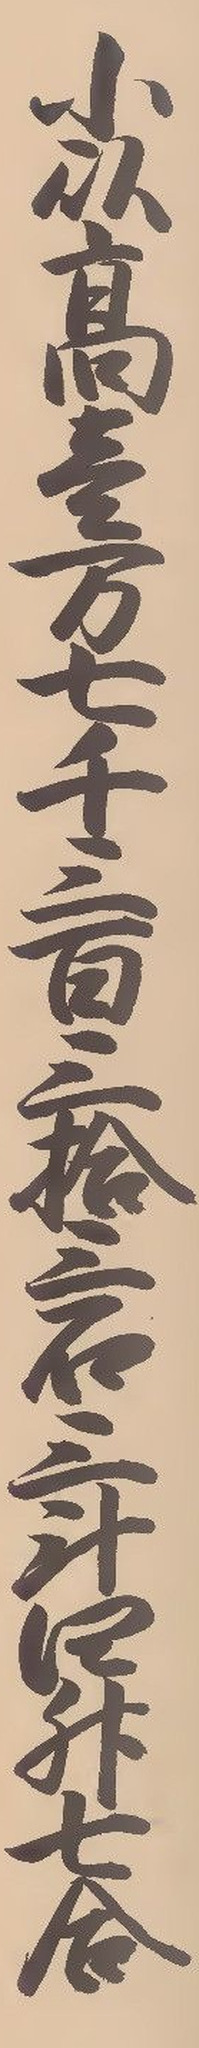小以高壱万七千三百三拾三石三斗四升七合

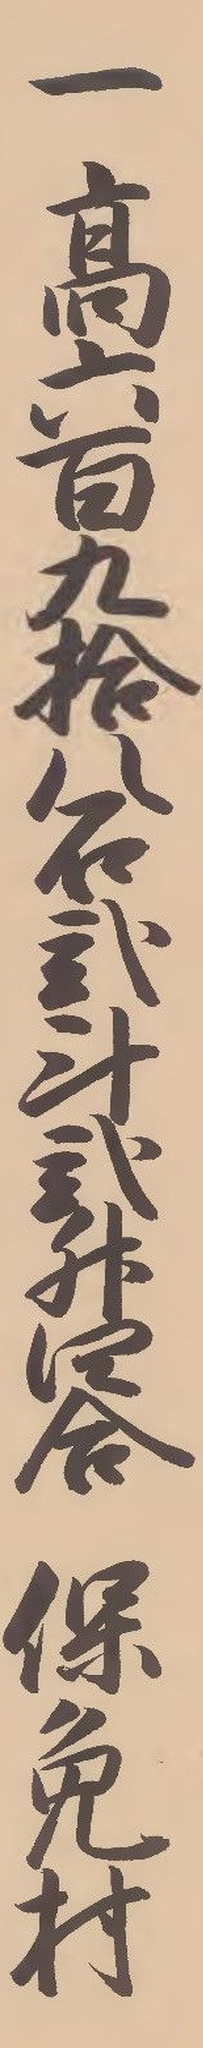一高六百九拾八石弐斗弐升四合保免村
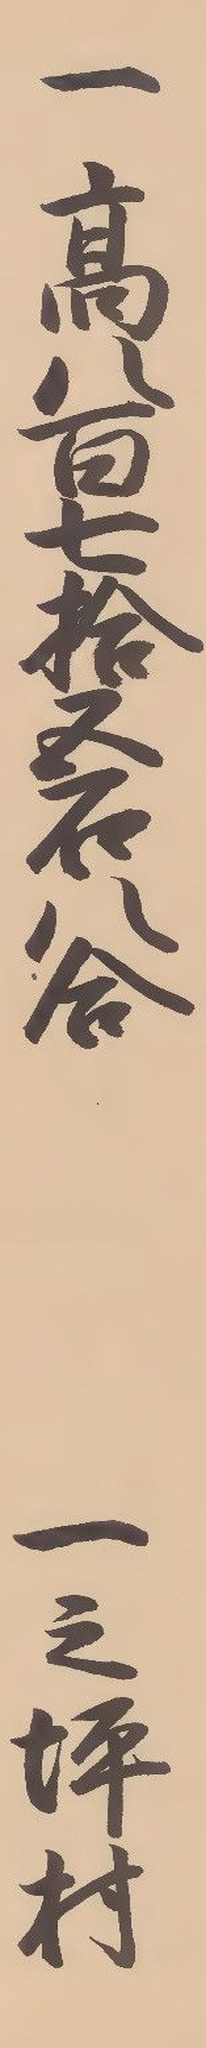一高八百七拾五石八合一之坪村
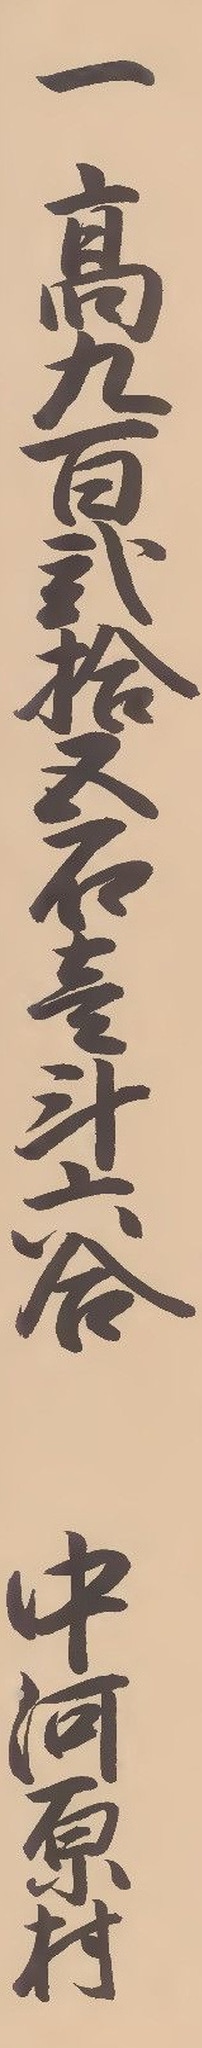一高九百弐拾五石壱斗六合中河原村
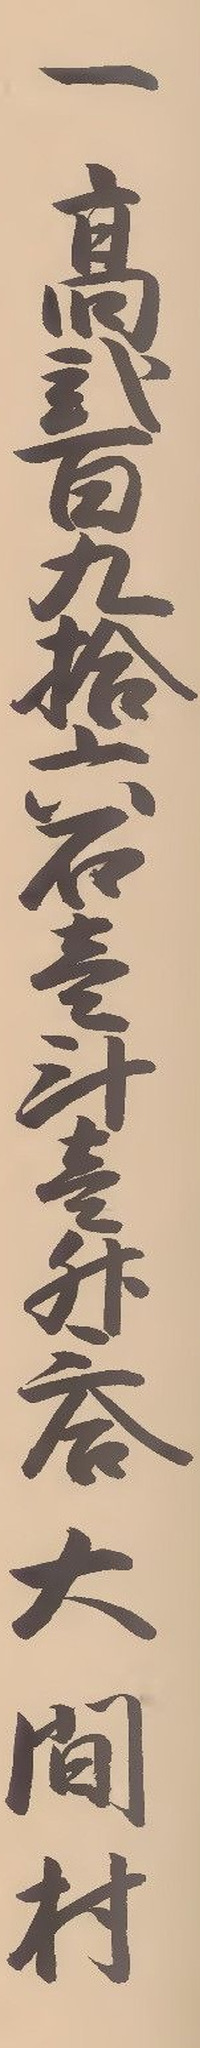一高弐百九拾六石壱斗壱升三合大間村
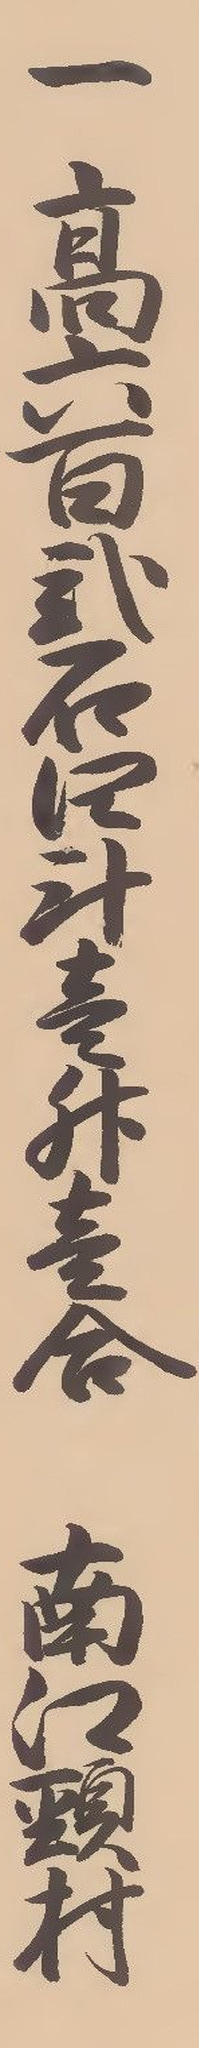一高六百弐石四斗壱升壱合南江頸村
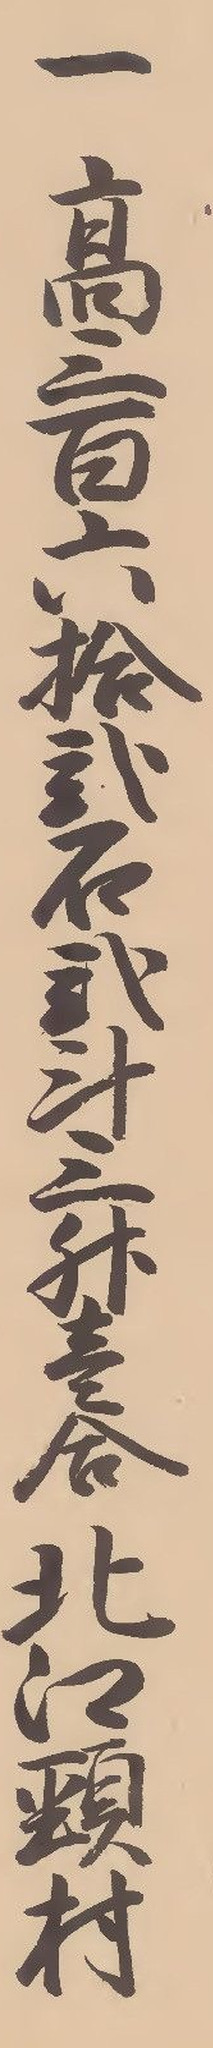一高三百六拾弐石弐斗三升壱合北江頸村
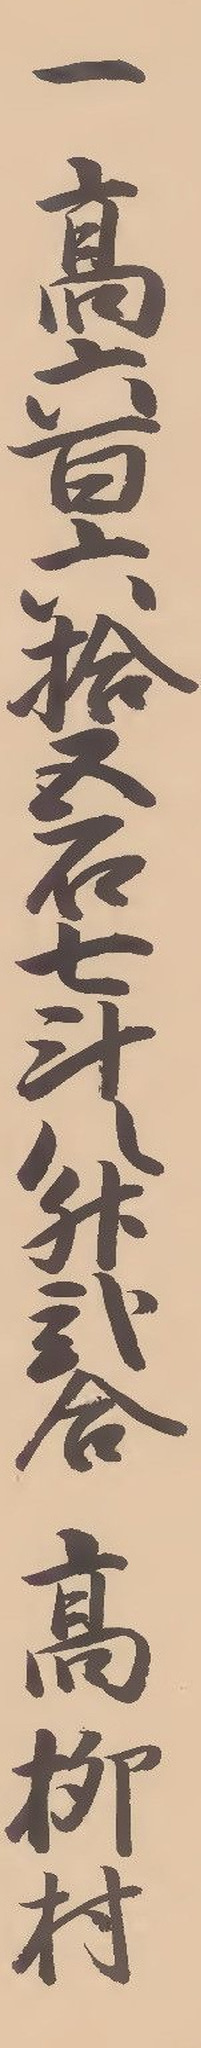一高六百六拾五石七斗八升弐合高柳村

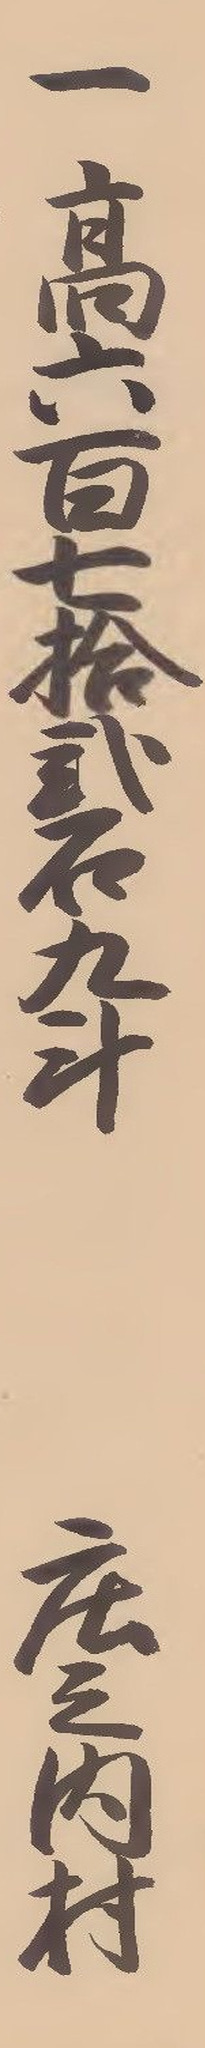一高六百七拾弐石九斗庄之内村
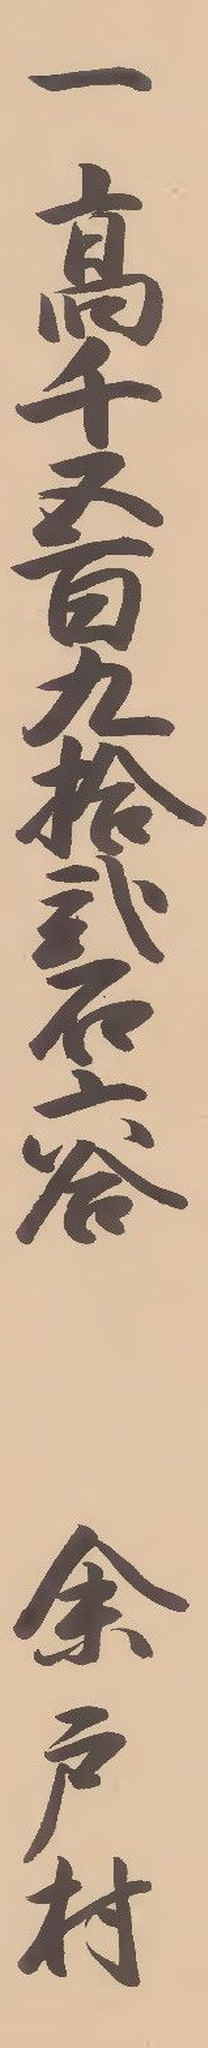一高千五百九拾弐石六合余戸村
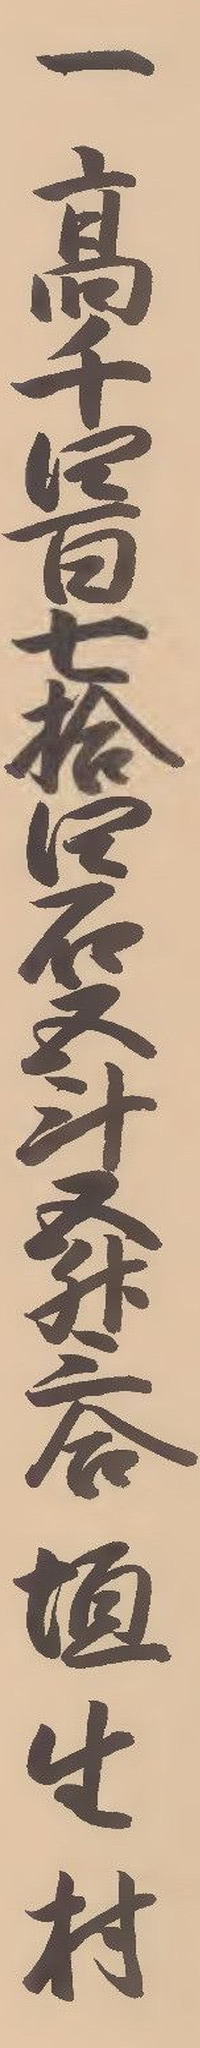一高千四百七拾四石五斗五升三合垣生村
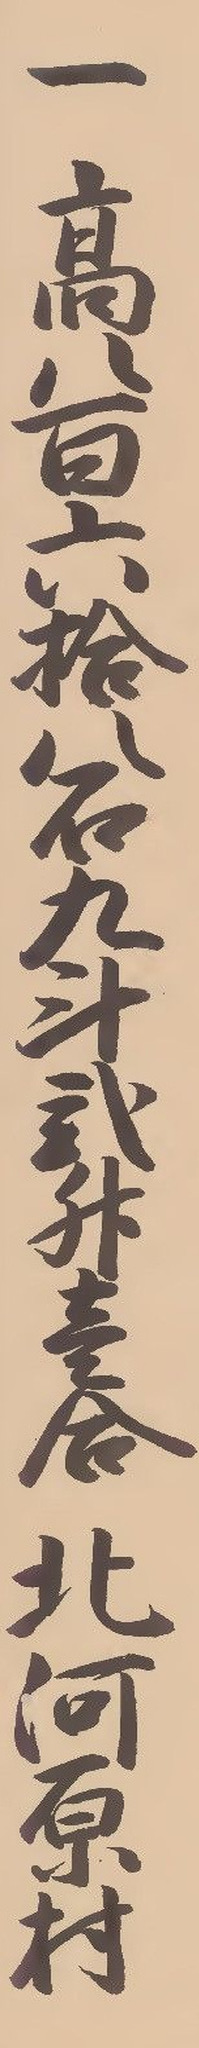一高八百六拾八石九斗弐升壱合北河原村
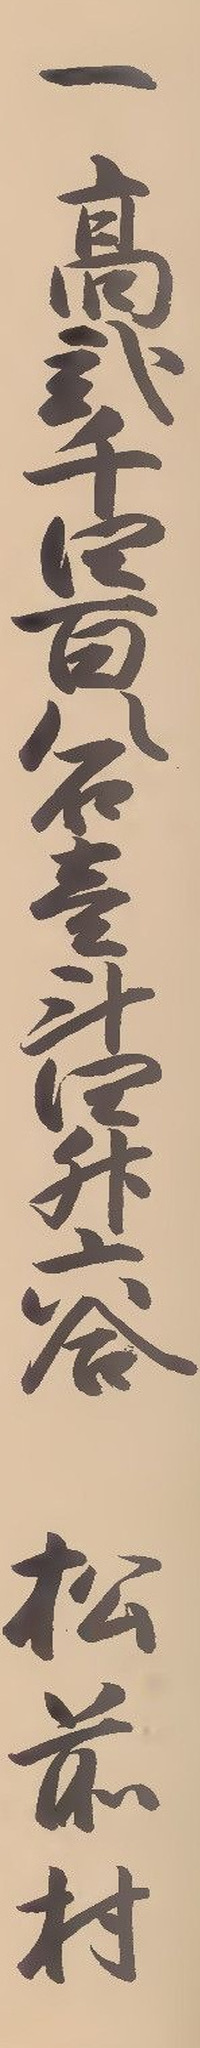一高弐千四百八石壱斗四升六合松前村
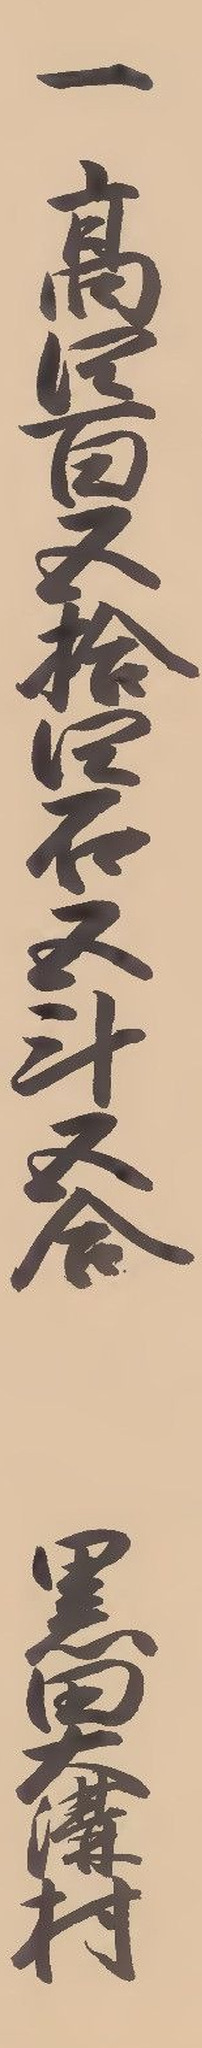一高四百五拾四石五斗五合黒田大溝村
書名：伊予国郷帳
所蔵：国立公文書館 National Archives of Japan
